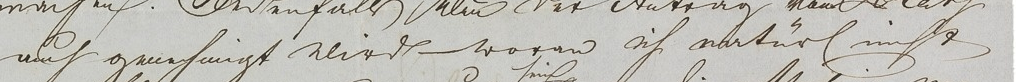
auch genehmigt wird – woran ich natürlich nicht
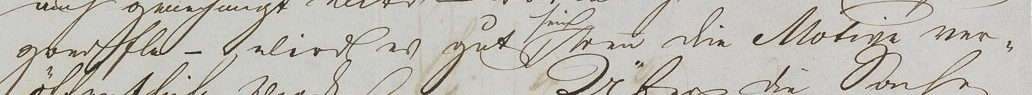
zweifle – wird es gut sein wenn die Motive ver-
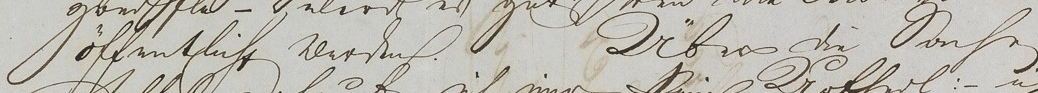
öffentlicht werden. Über die Sache
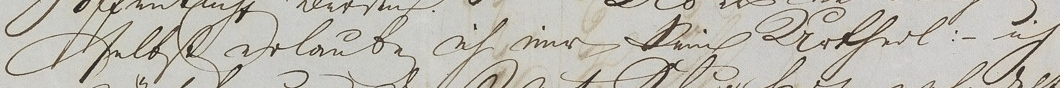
selbst erlaube ich mir kein Urtheil: – ich
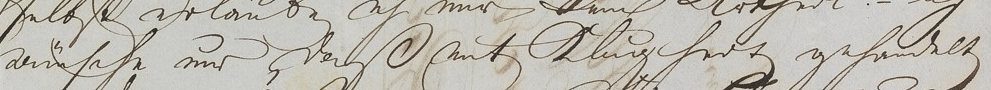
wünsche nur daß mit Klugheit gehandelt
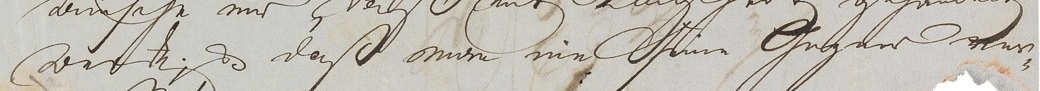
werde; & daß man nie seine Gegner ver-
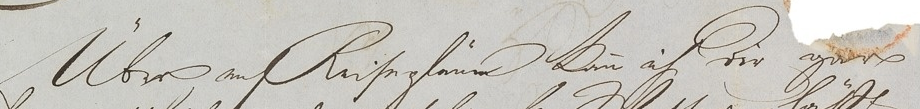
Über m Reisepläne kann ich dir gar
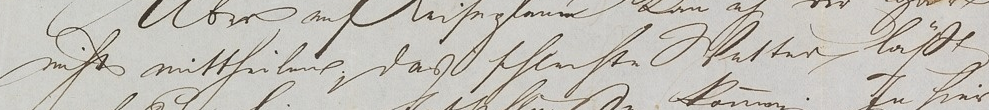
nichts mittheilen; das schlechte Wetter läßt
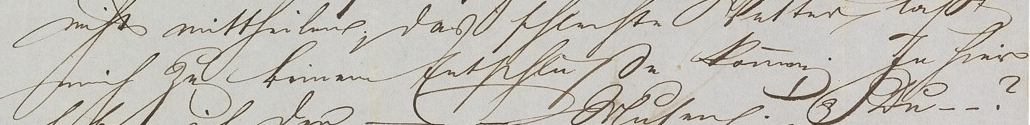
mich zu keinem Entschlusse kommen. In hier
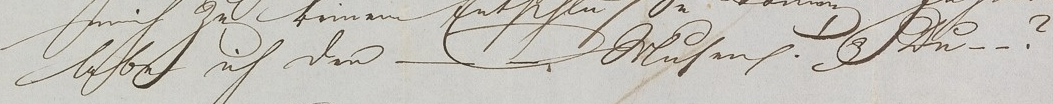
lebe ich den – – Musen. & Du – –?
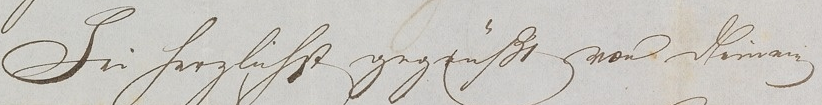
Sei herzlichst gegrüsst von deinem
